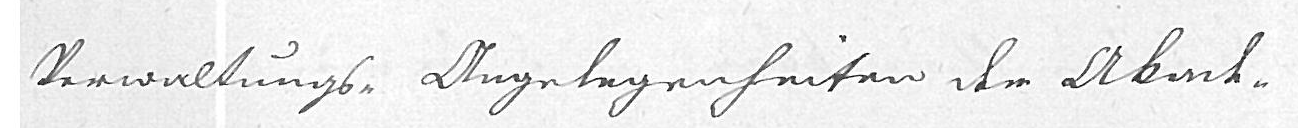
Verwaltungs-Angelegenheiten der Akade-
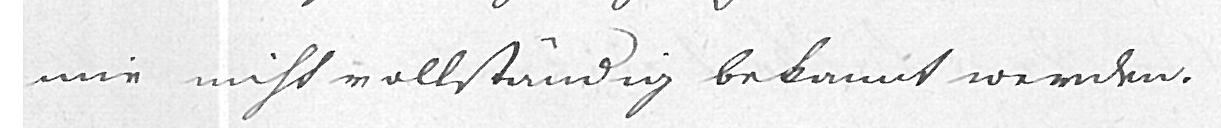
mie nicht sollständig bekannt werden.
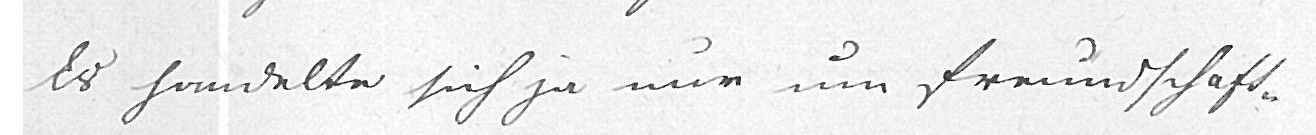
Es handelte sich ja nur um freundschaft-
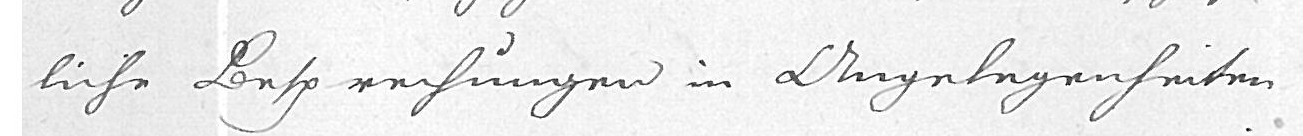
liche Besprechungen in Angelegenheiten
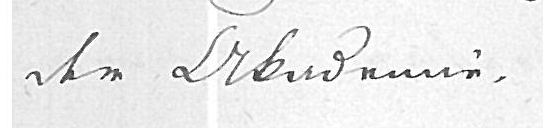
der Akademie
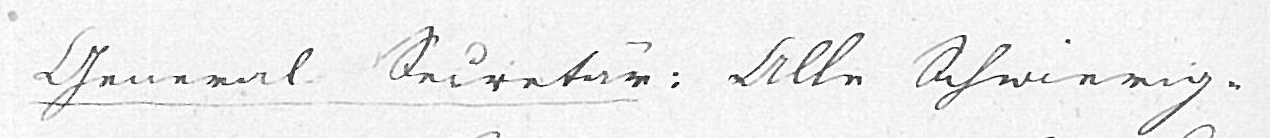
General-Secretär: Alle Schwierig-
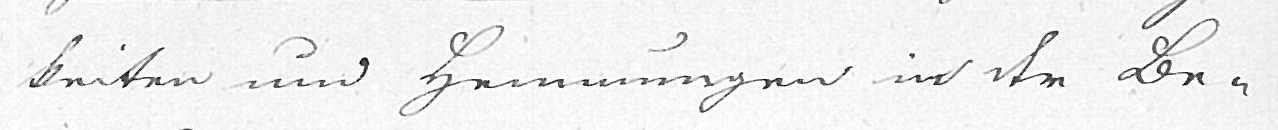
keiten und Hemmungen in der Be-
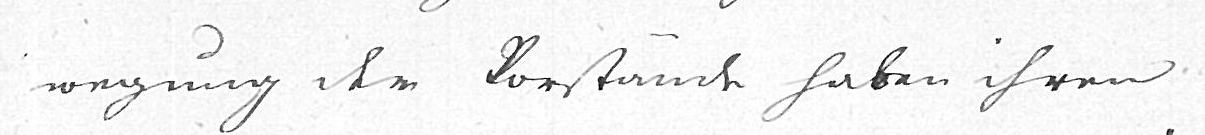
wegung der Vorstände haben ihren
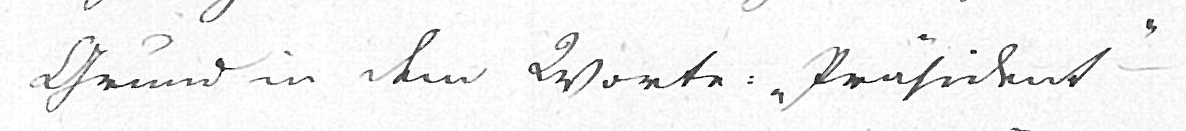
Grund in dem Worte "Präsident",
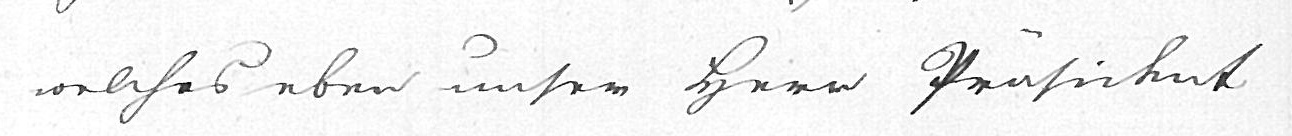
welches eben unser Herr Präsident
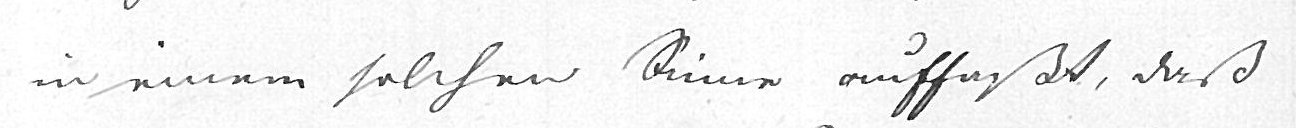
in einem solchen Sinne auffaßt, daß
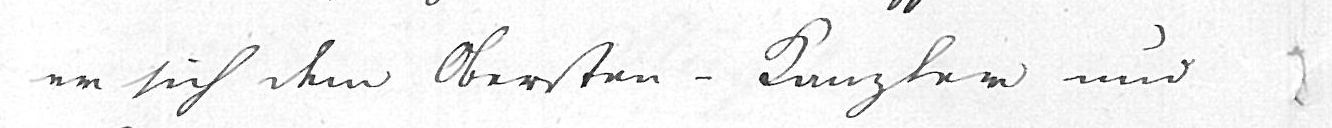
er sich dem Obersten-Kanzler und
